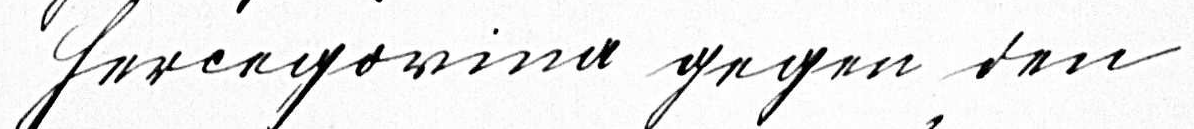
Hercegovina gegen den
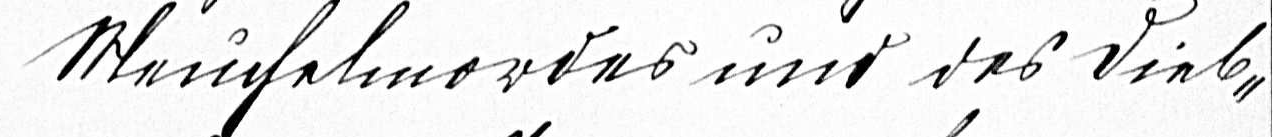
Meuchelmordes und des dieb¬
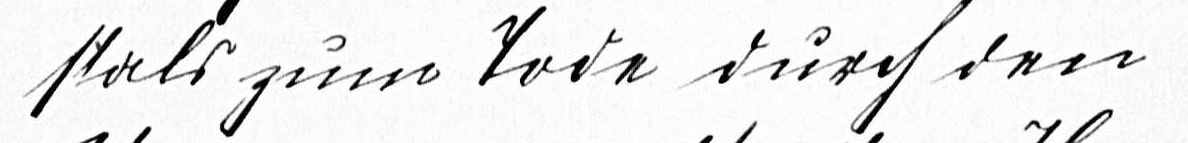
stals zum Tode durch den
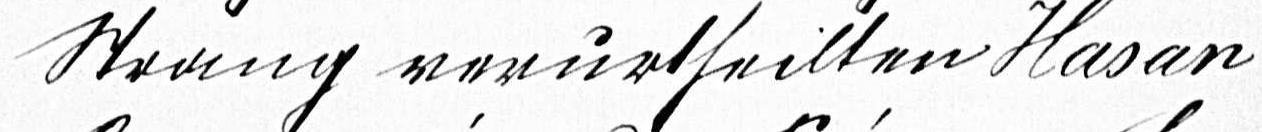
Strang verurtheilten Hasan
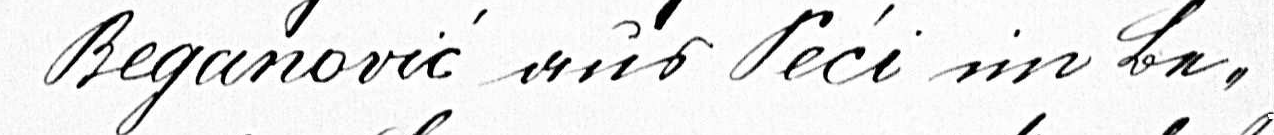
Beganović aus Seći im Be¬
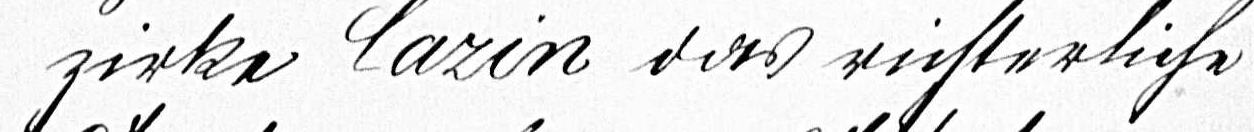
zirke Cazin das richterliche
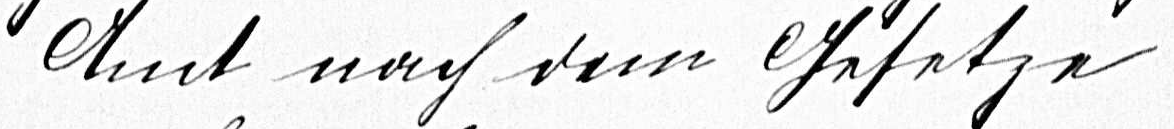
Amt nach dem Gesetze
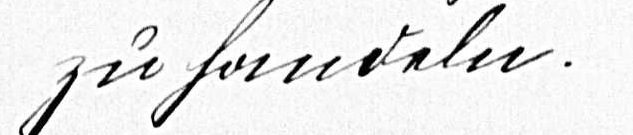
zu handeln.
